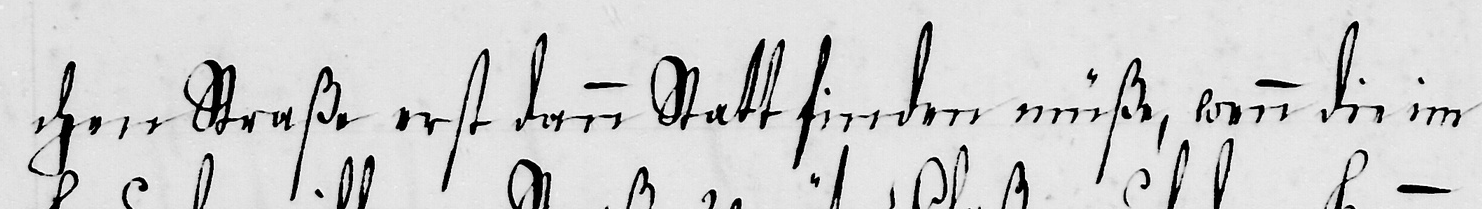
chen Straße erst dann Statt finden müße, wenn die im
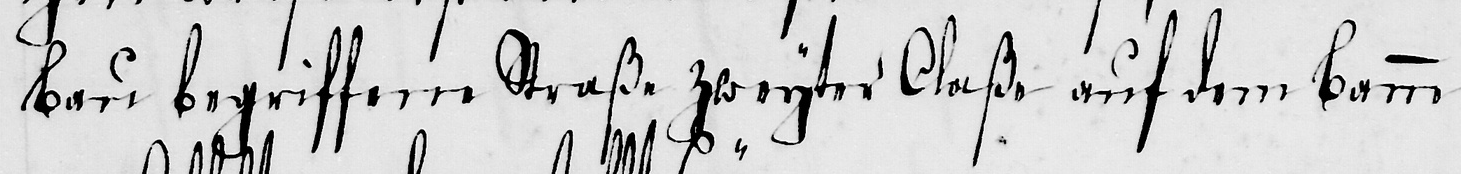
Bau begriffene Straße zweyter Claße auf dem Banne
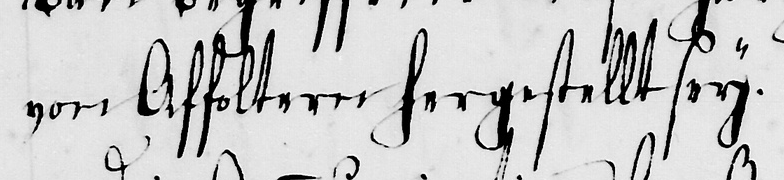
von Affoltern hergestellt sey.
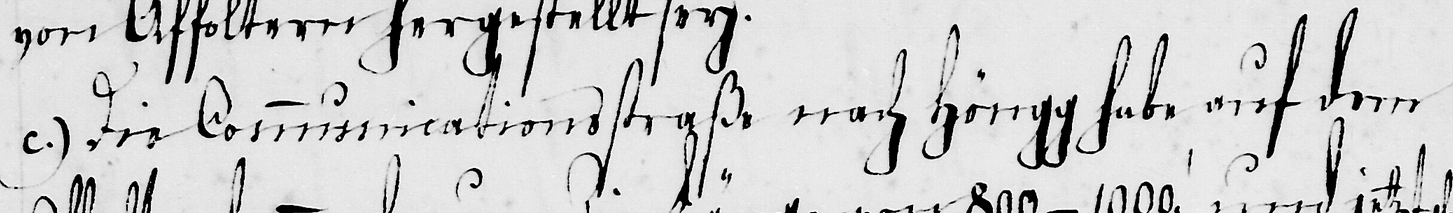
c.) Die Communicationsstraße nach Höngg habe auf dem
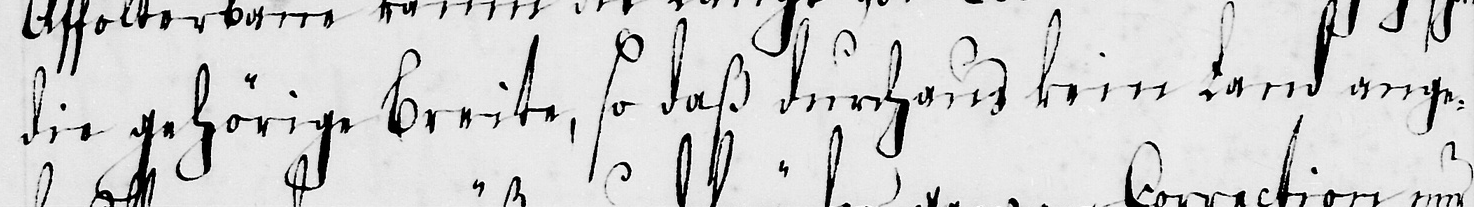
die gehörige Breite, so daß durchaus kein Land ange¬
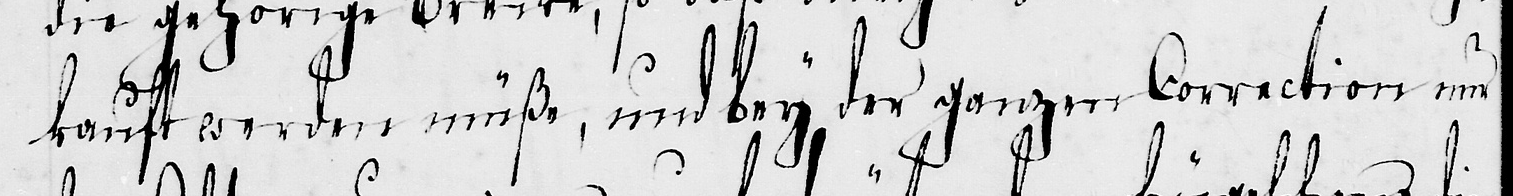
kauft werden müße, und bey der ganzen Correction nur
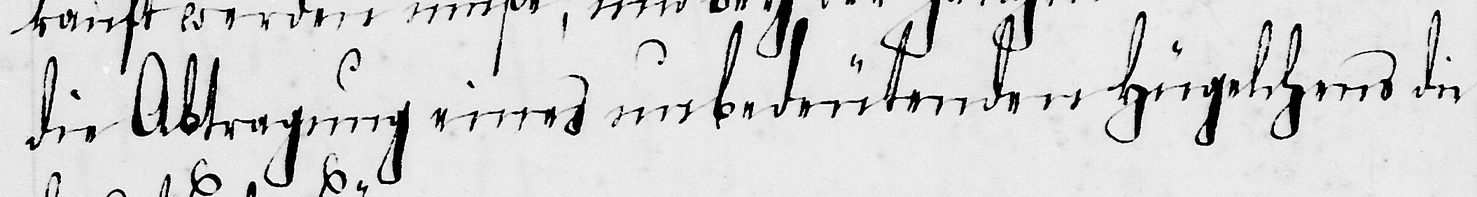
die Abtragung eines unbedeutenden Hügelchens die
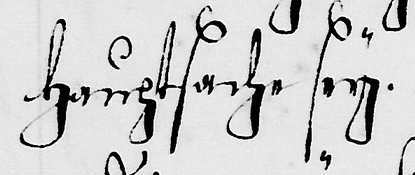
Hauptsache se¬
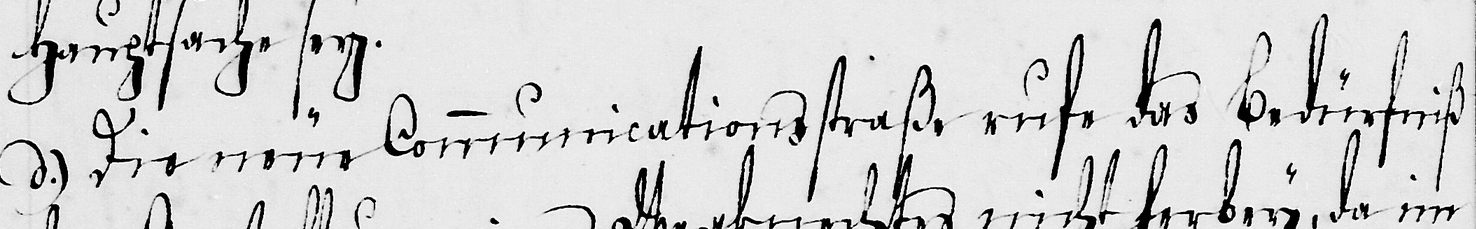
d.) Die neue Communicationsstraße rufe das Bedürfniß
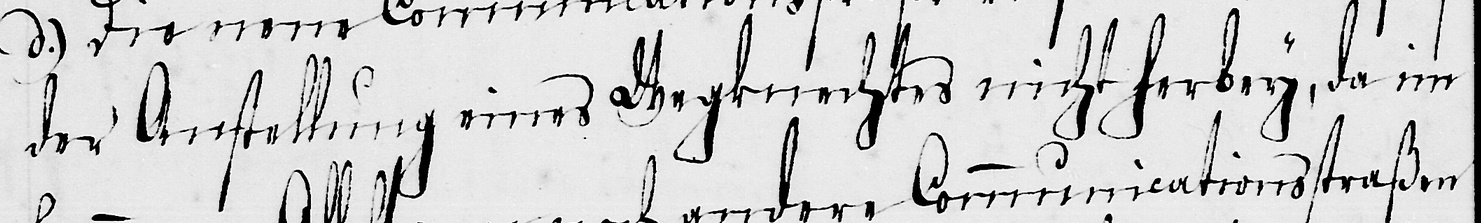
der Anstellung eines Wegknechtes nicht herbey, da im
